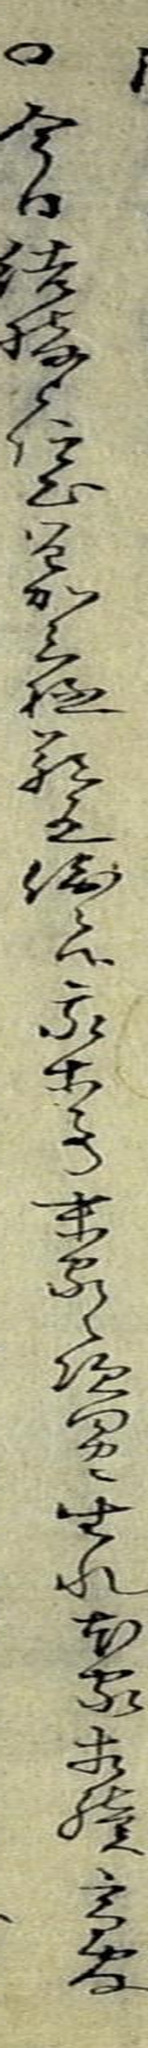〇今日結構被仰出冥加至極難有儀ニ候我等事末家之次男ニ生れ本家相続高官
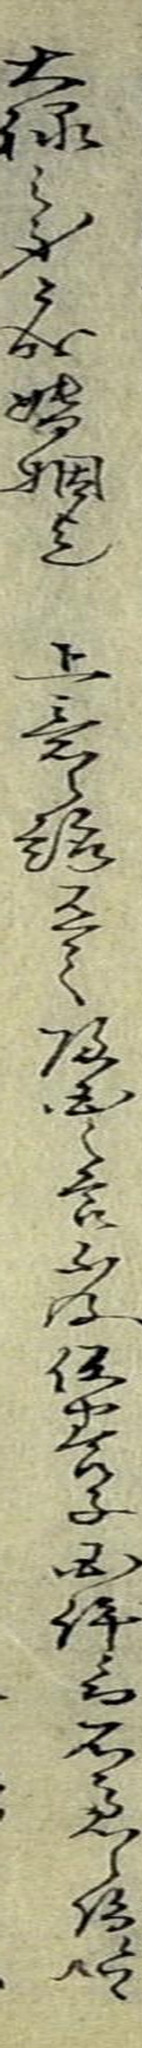大禄之身ニ成婚姻迄上意之趣有之帰国之節不及仮養子国許ニ而不慮之儀候ハヽ
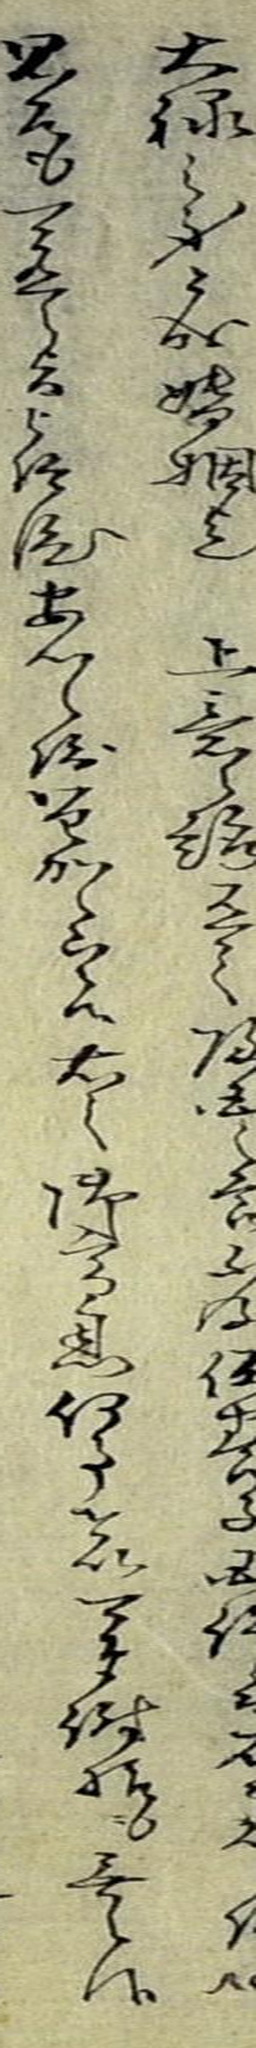思召も可有之旨被仰渡安心之儀冥加之至ニ候右之御高慮何事を以可奉謝様も無之候
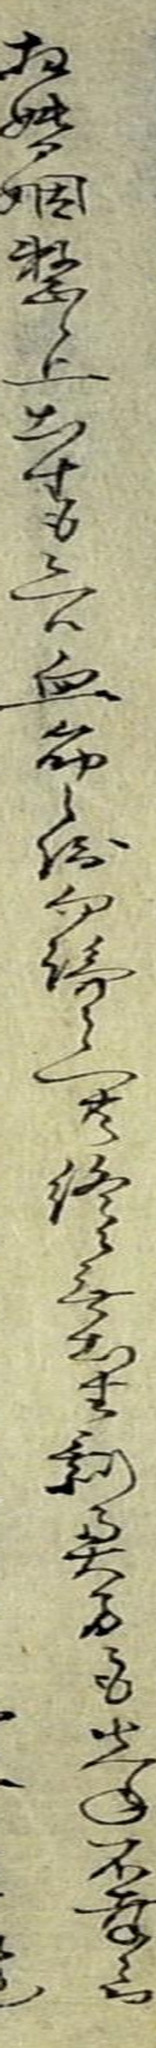於婚姻整候上出生も候ヘハ血筋之儀勿論ニ候へ共終ニ無出生剰奥方ニも先年不幸ニ而
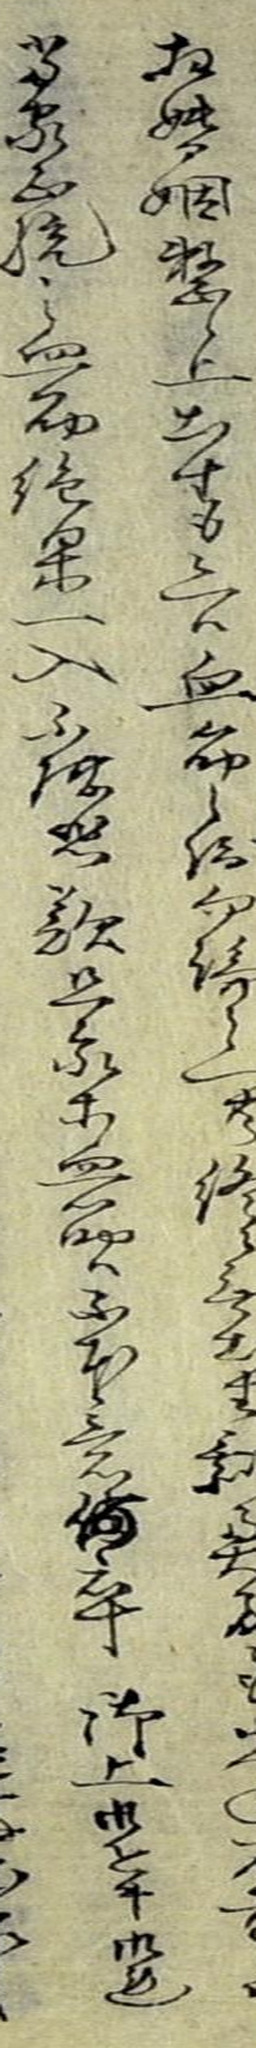当家正統之血筋絶果一入不堪悲歎且我等血筋ハ不本意何卒御上御近キ御連
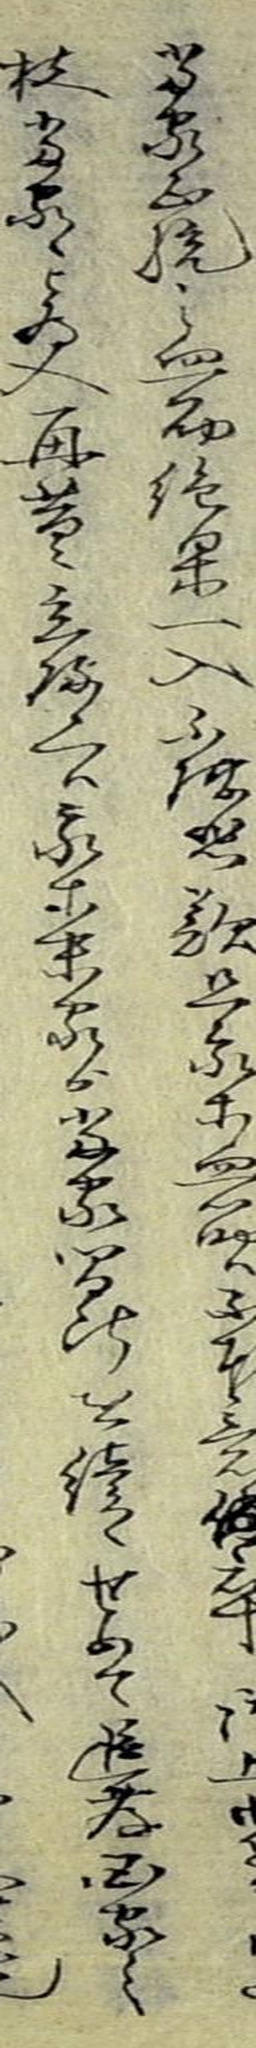枝当家へ被為入再昔ニ立帰候ヘハ我等末家ゟ当家間断を続候せめて追孝国家之
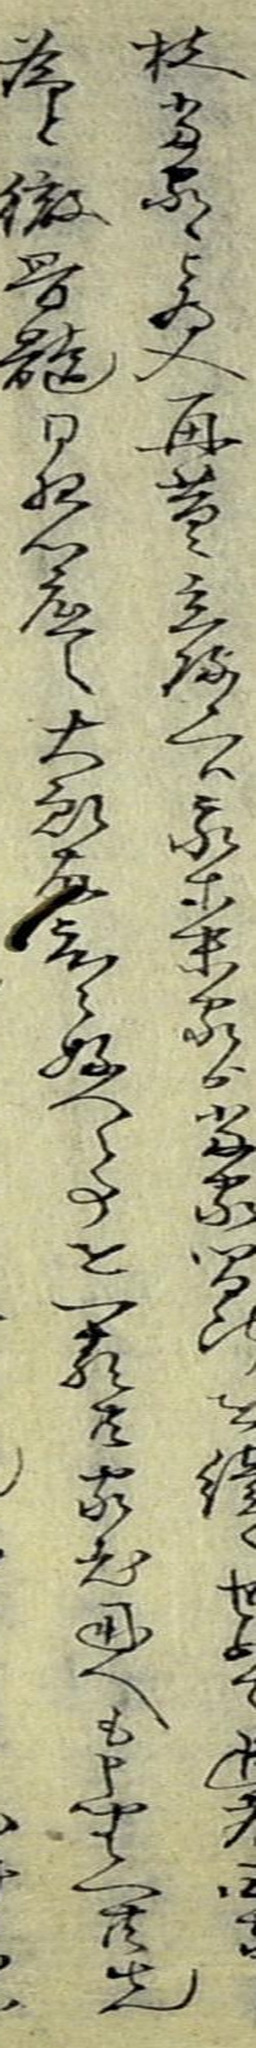為と徹骨髄日夜心底之大願故度々好人之事を一類共家老用人も申聞候へ共先
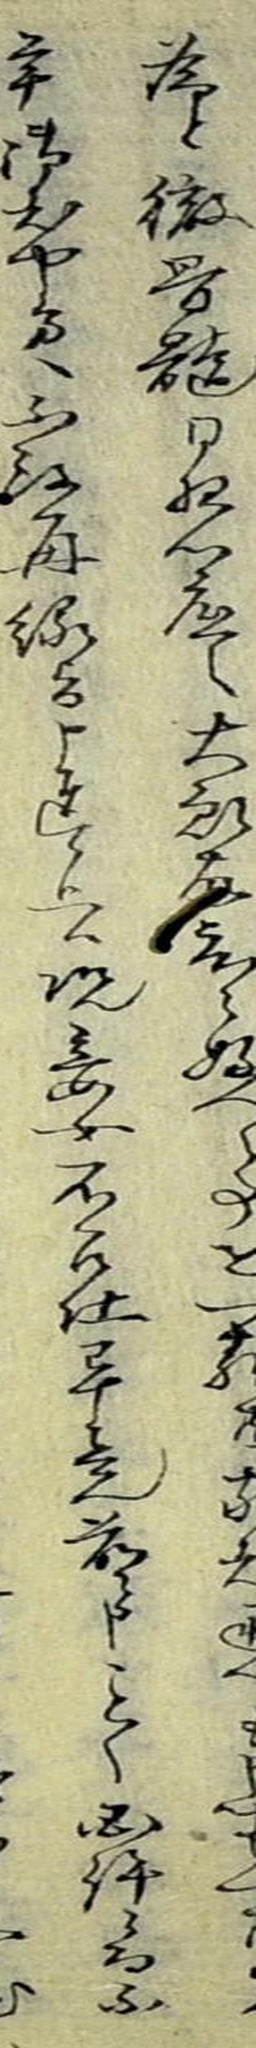年御老中方へ不致再縁旨申達候上ハ妾女不召仕畢竟前々申ことく国許ニ而不
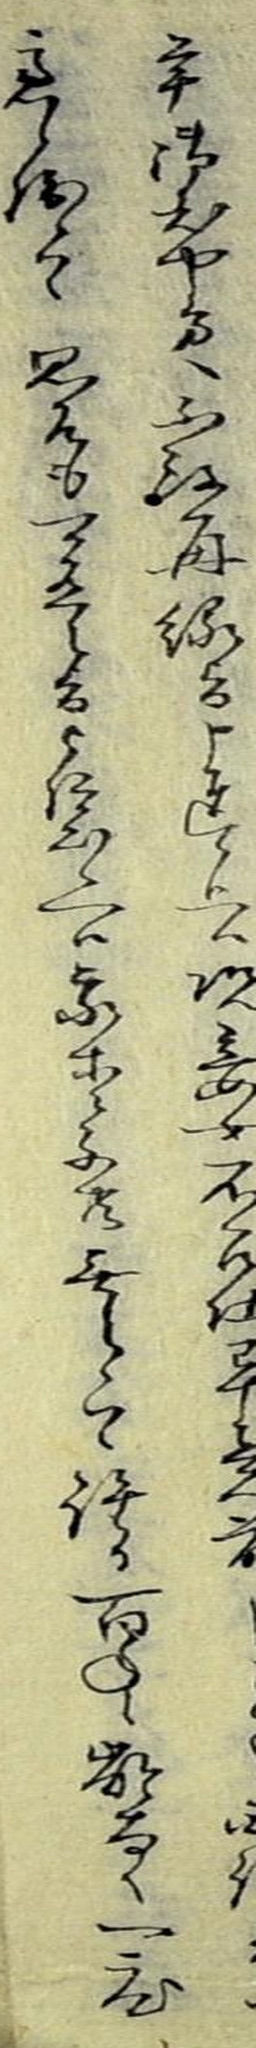慮之儀候ハヽ思召も可有之旨被仰出候ヘハ我等ニ子共無之候ハヽ誰か百年之齢なく一度

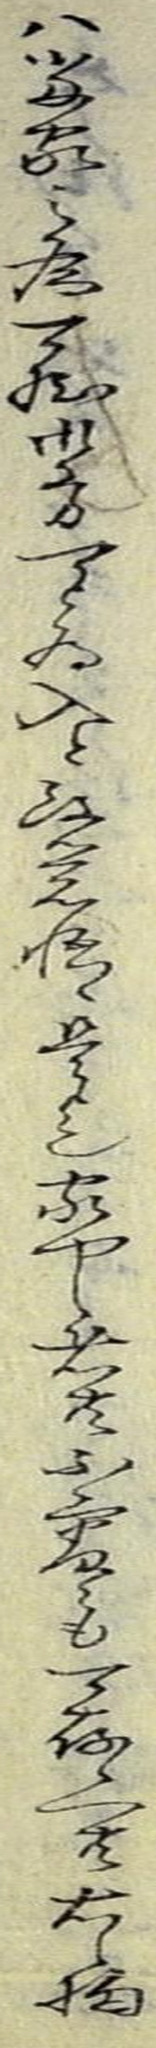ハ当家之為可然御方可被為入と致覚悟候是迄家中之者共不審ニも可存候へ共右之胸
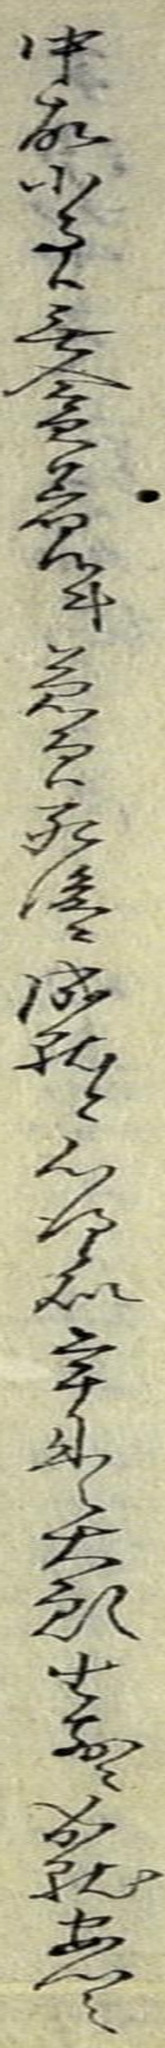中故小事ハ無貪着候キ兼而ハ死後ニ成就と心得候処年来之大願生前ニ成就安心之
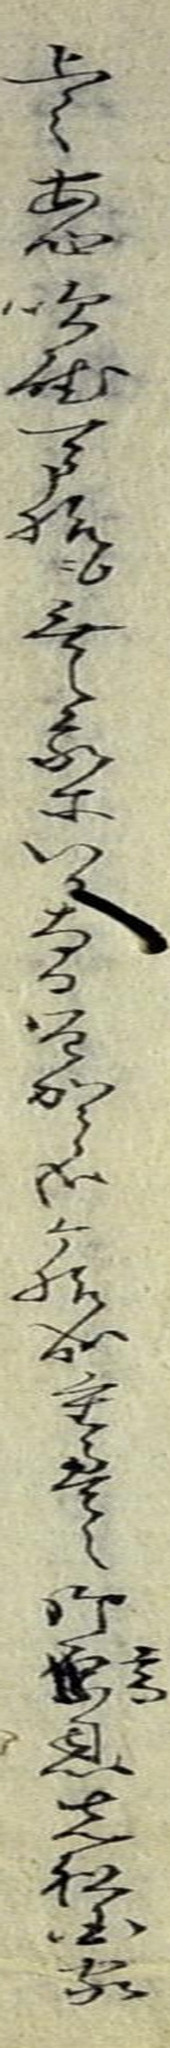上之安心吹聴可申様も無之我等いかなる冥加ニ候哉ケ様成重畳之御高恩先祖国家
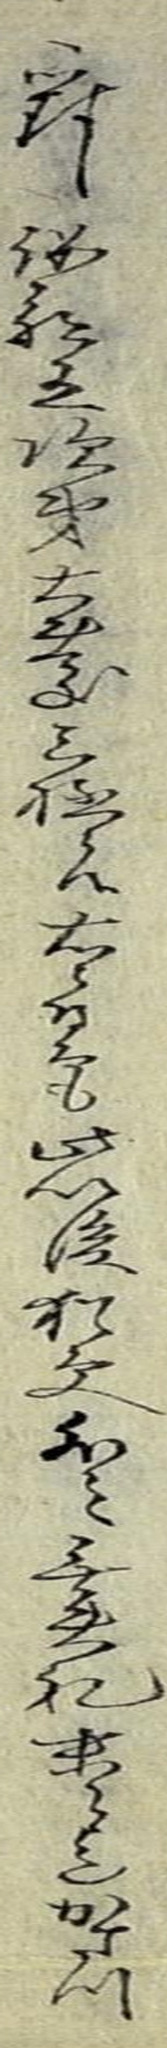へ対し誠難有次第大慶至極ニ候右ニ付而も此以後猶更外々へ無失礼末々迄かさつ
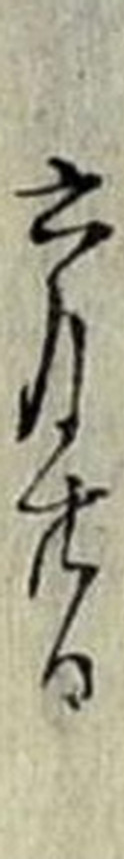六月廿日
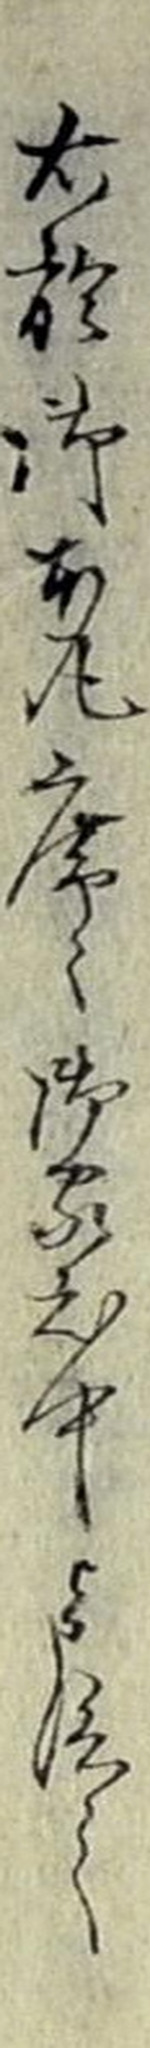右於御本丸席々御家老中被申渡之
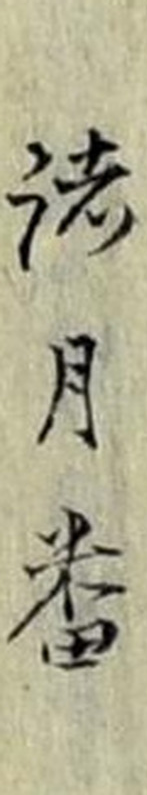諸月番
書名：命令之部 一
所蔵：福井県文書館 Fukui Prefectural Archives
